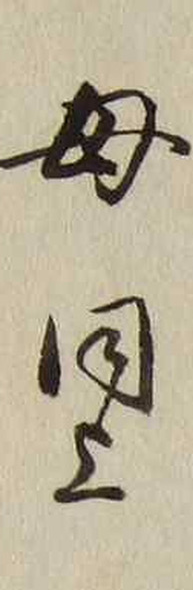母同上
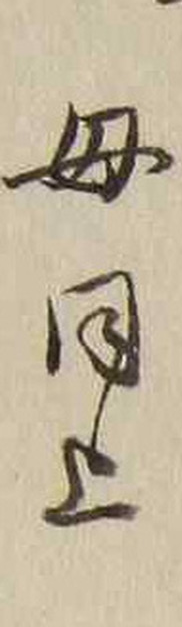母同上

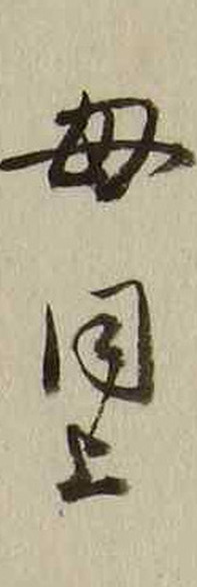母同上
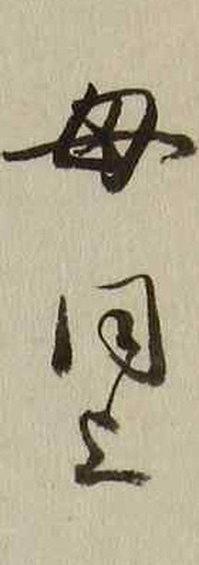母同上
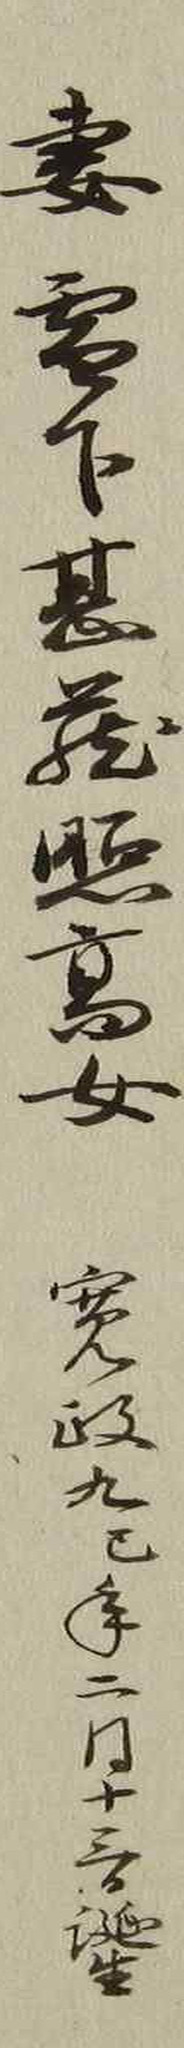妻雪下甚蔵照高女寛政九巳年二月十三日誕生
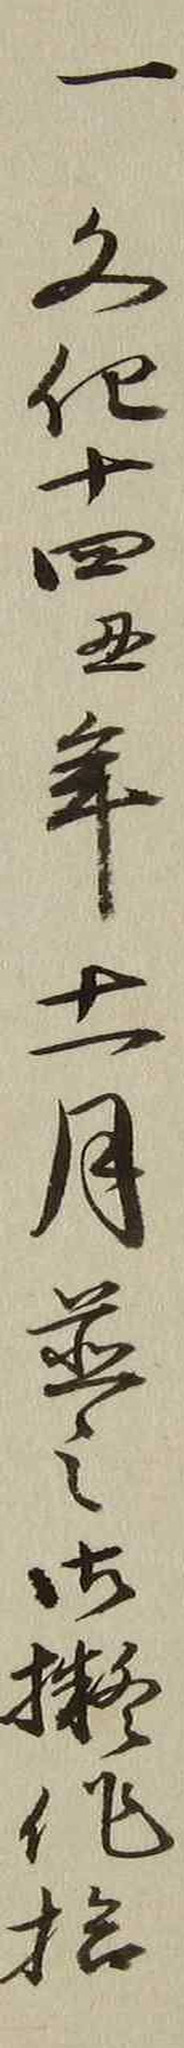一文化十四丑年十一月並之御擬作拾
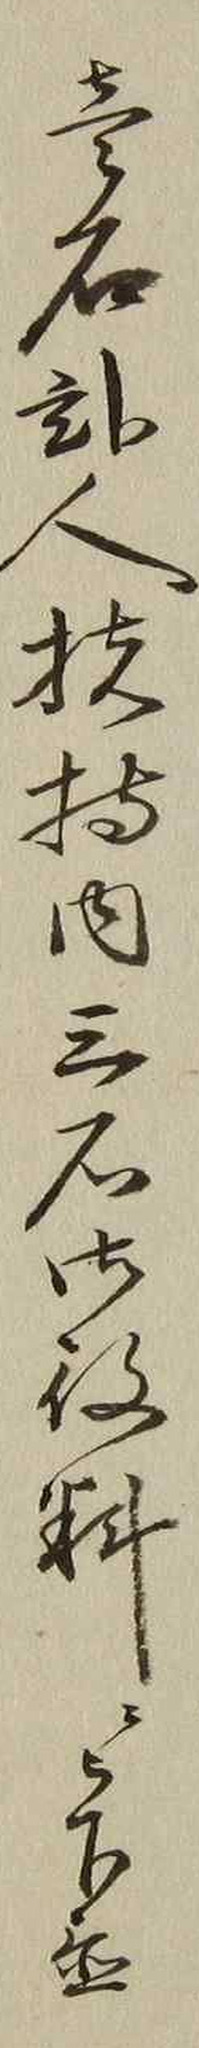壱石弐人扶持内三石御役料ニ而下置
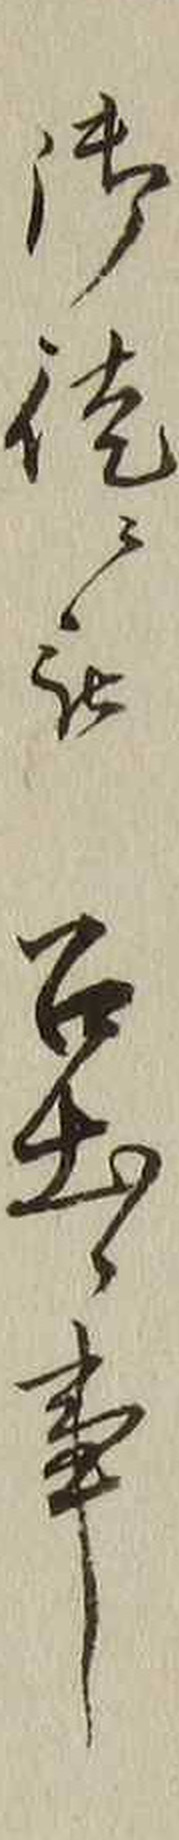御徒ニ被召出候事
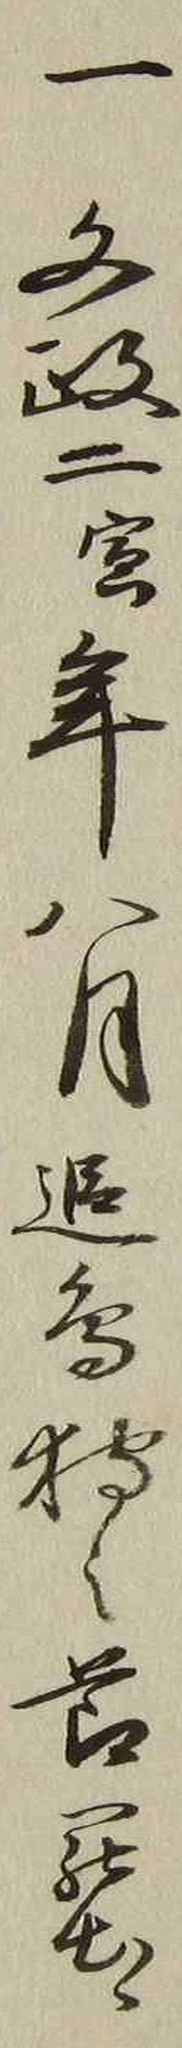一文政二寅年八月追鳥狩之節罷出候
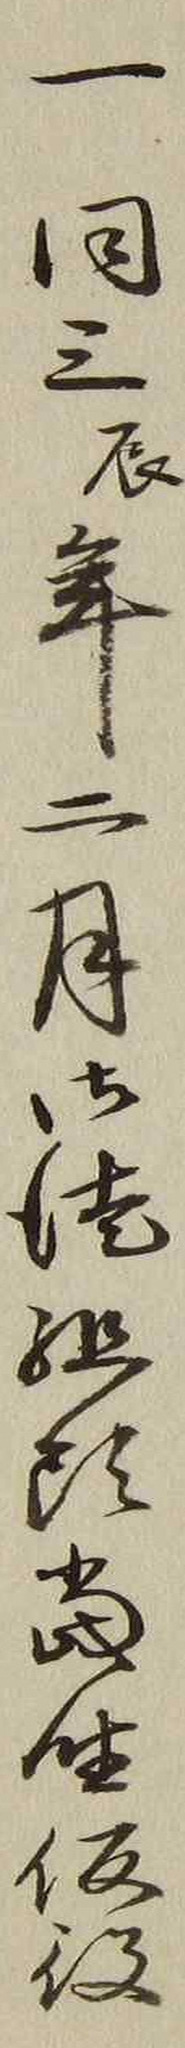一同三辰年二月御徒組頭当坐仮役
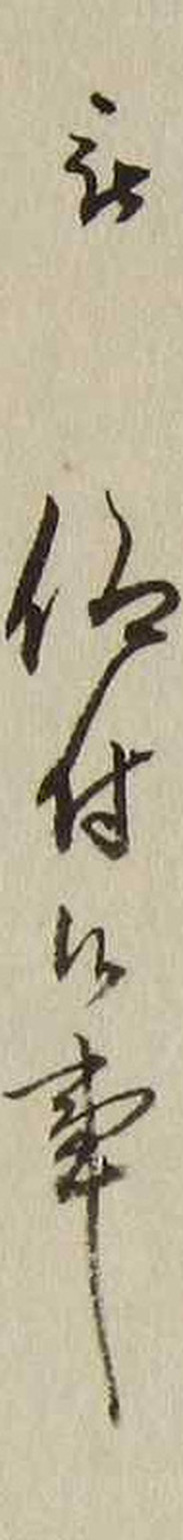被仰付候事
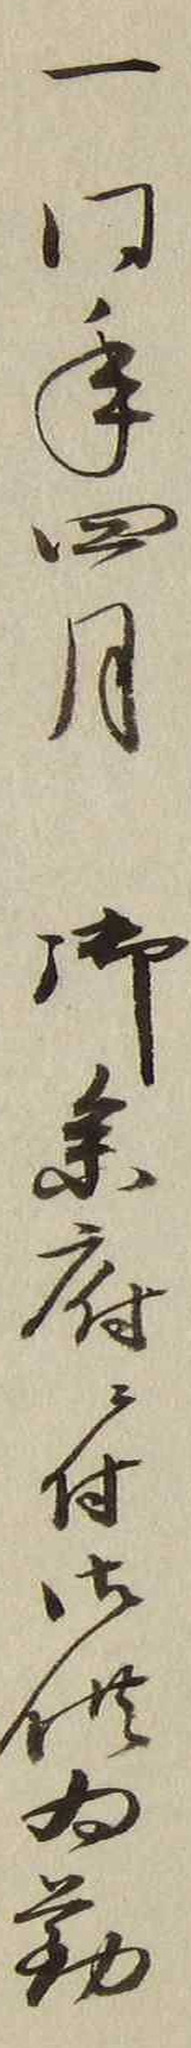一同年四月御参府ニ付御供為勤
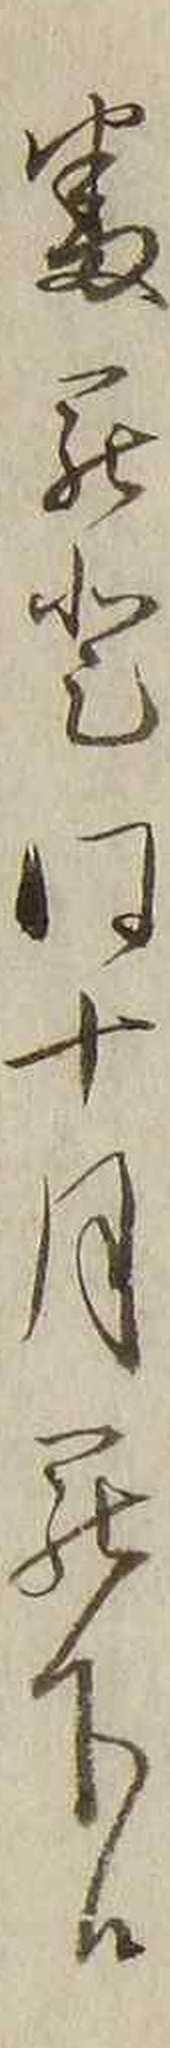番罷登同十月罷下候
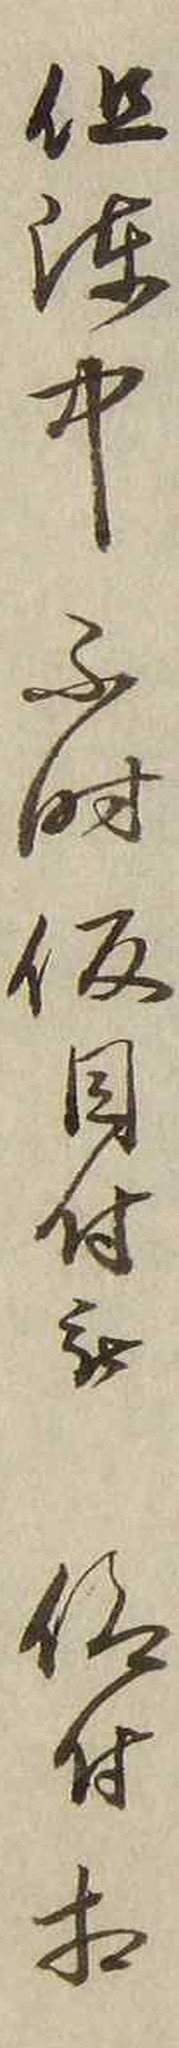但陣中不時仮目付被仰付相

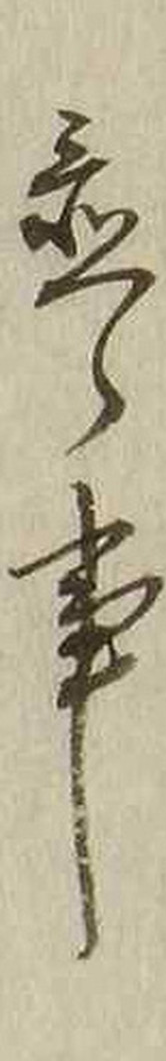置候事
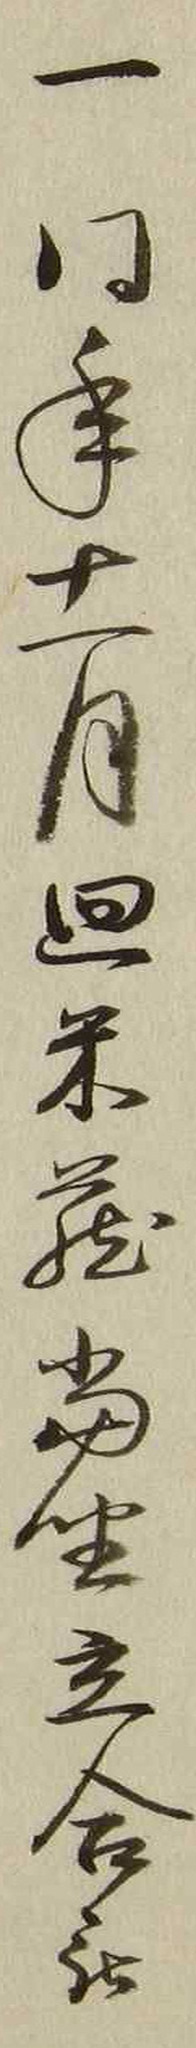一同年十一月廻米蔵当坐立合被
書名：諸士系譜　巻之102　か之部10
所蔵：会津若松市立会津図書館
